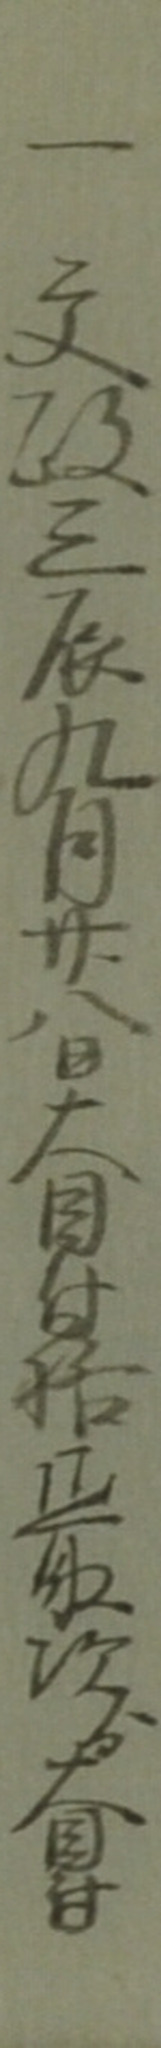一文政三辰九月廿八日大目付格御取次ゟ大目付
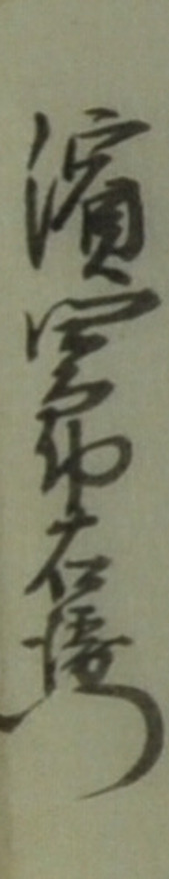浜四郎右衛門

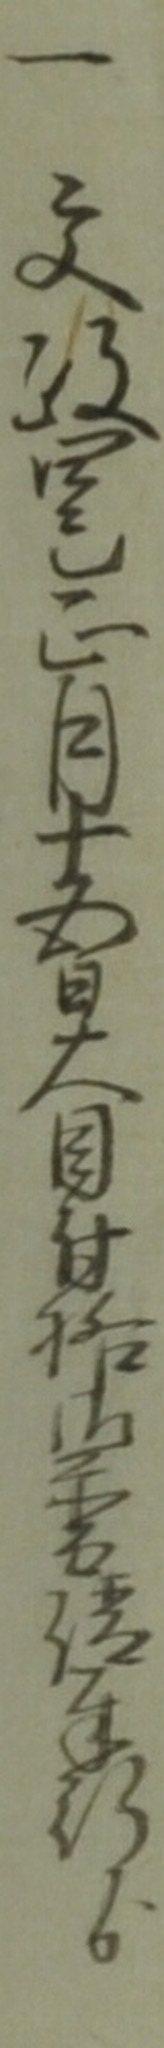一文政四巳正月十五日大目付格御普請奉行ゟ
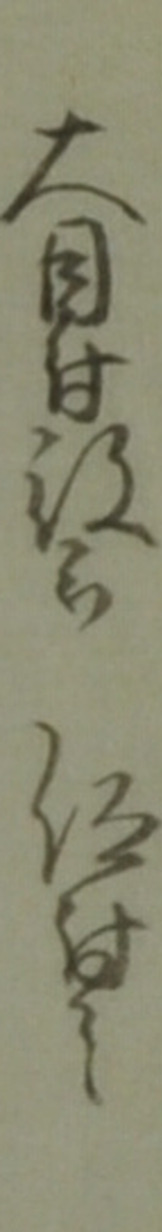大目付役被仰付之
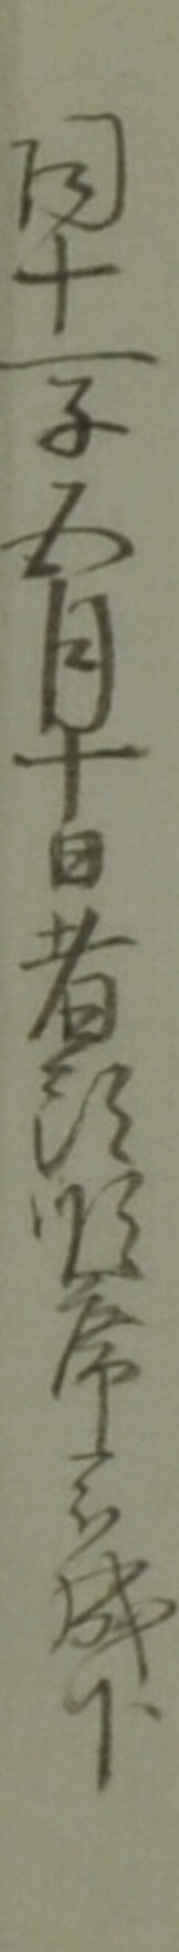一同十一子五月十日者頭順席被成下
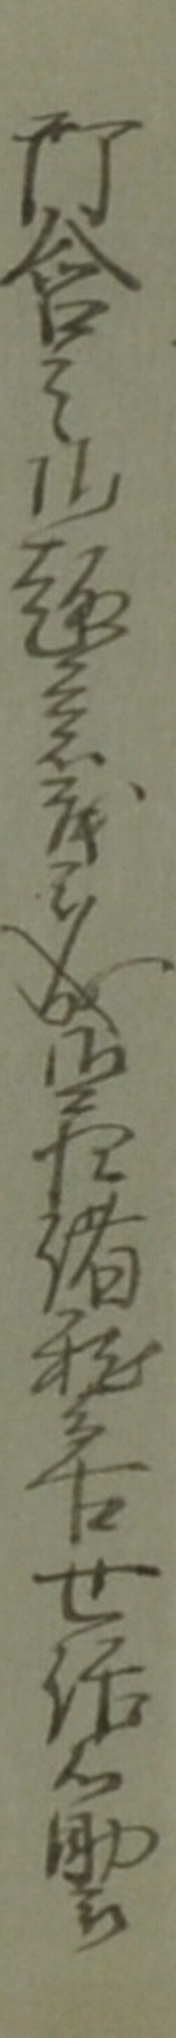御含之御趣意茂被成御座諸稽古世話筋被
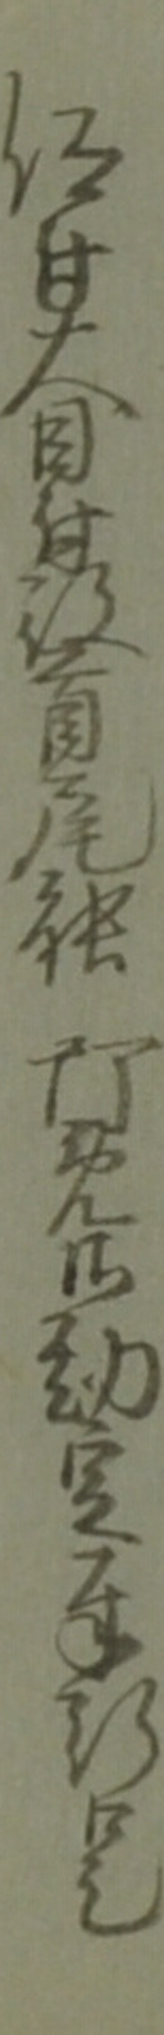仰付大目付役首尾能御免勘定奉行是
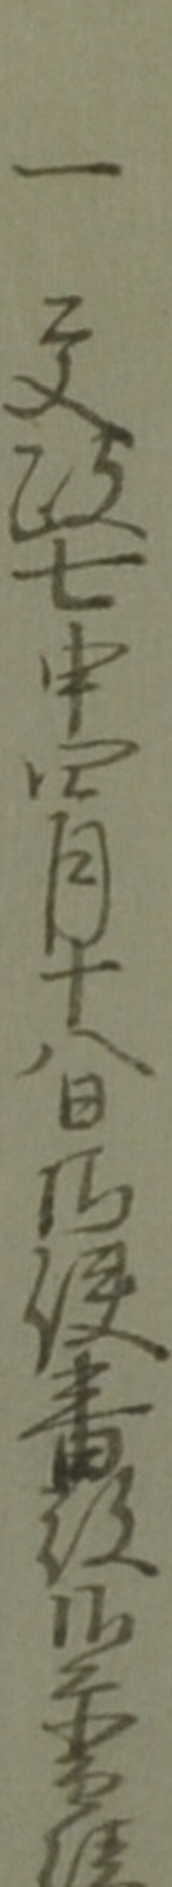一文政七申四月十八日御使番役御普請奉行
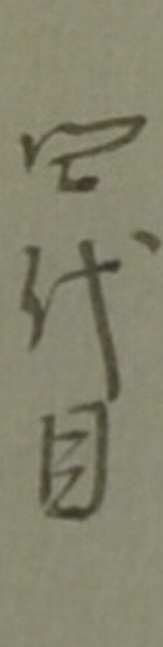四代目
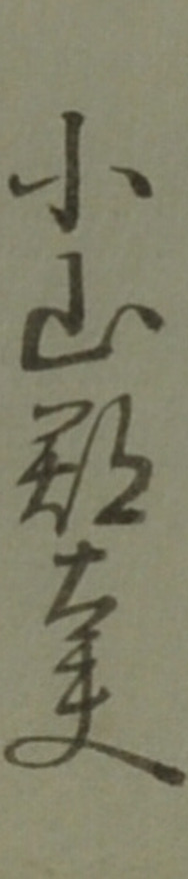小山郡太夫
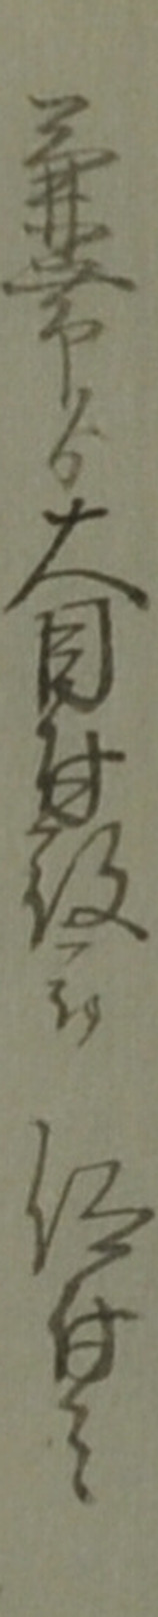兼帯ゟ大目付役被仰付之
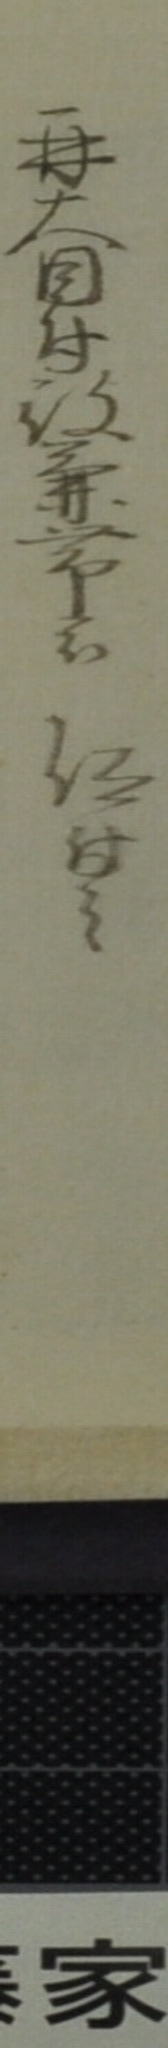再大目付役兼帯被仰付之
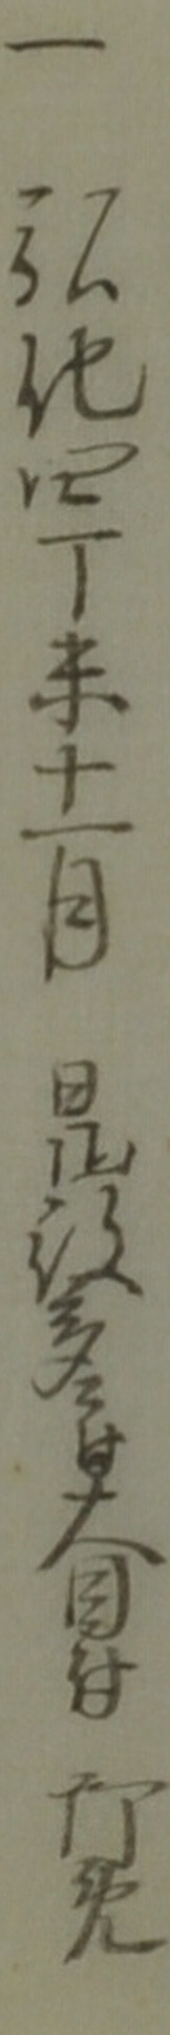一弘化四丁未十一月日御役多ニ付大目付御免
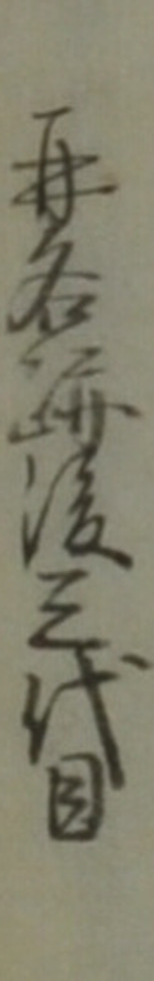再名跡後三代目
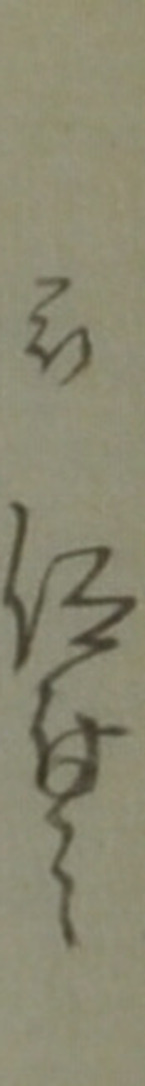被仰付之
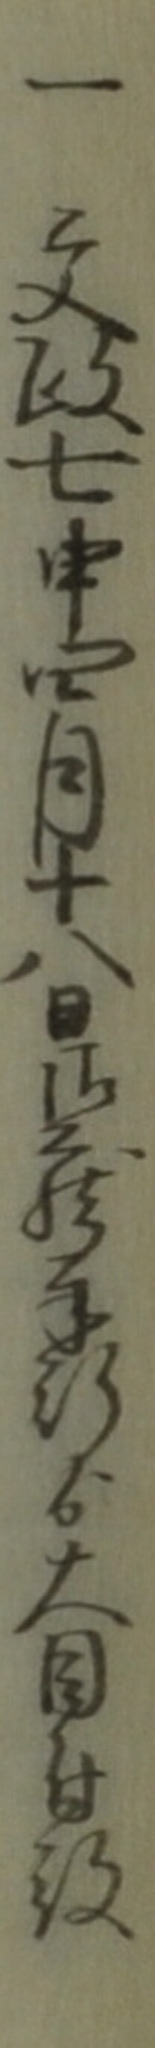一文政七申四月十八日御蔵奉行ゟ大目付役
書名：諸御役代々録（三）
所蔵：伊那市立高遠町図書館・合同会社AMANE
